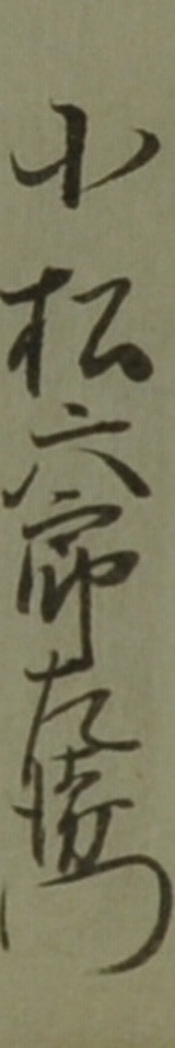小松六郎左衛門
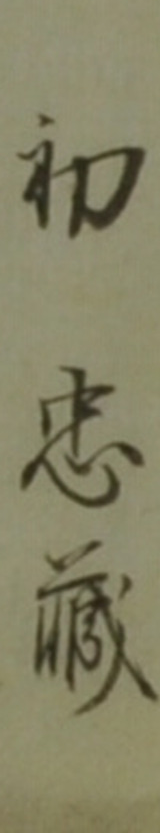初忠蔵
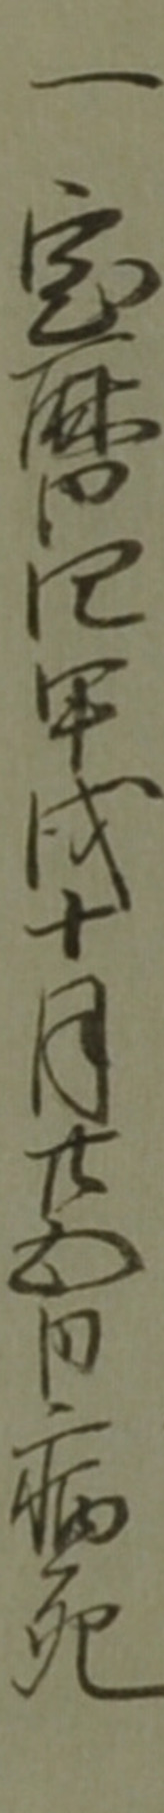一宝暦四甲戌十月廿五日病死
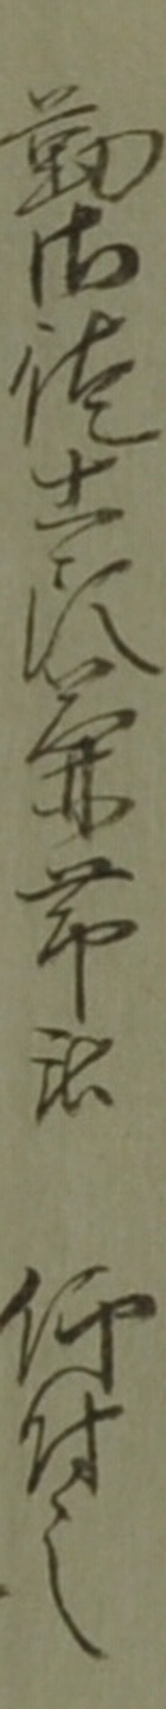勤御徒士頭兼帯被仰付之
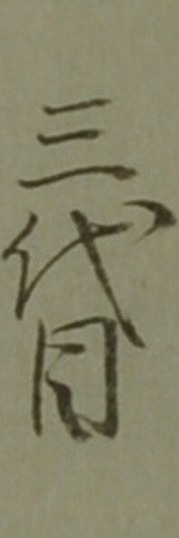三代目
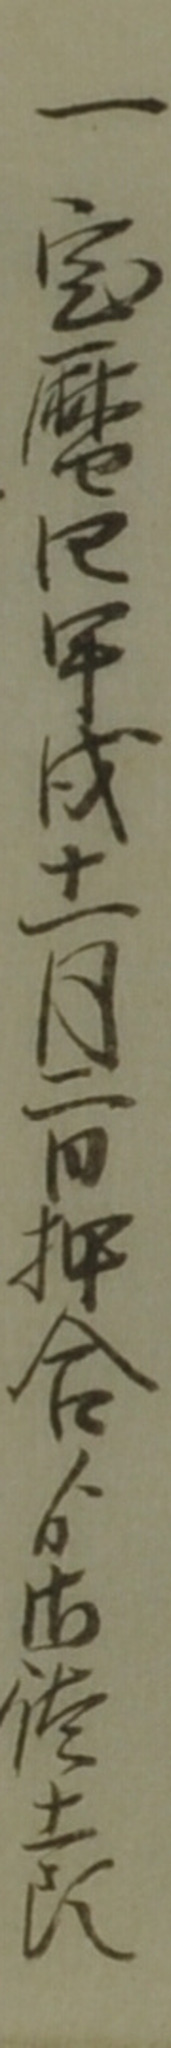一宝暦四甲戌十一月二日押合ゟ御徒士頭
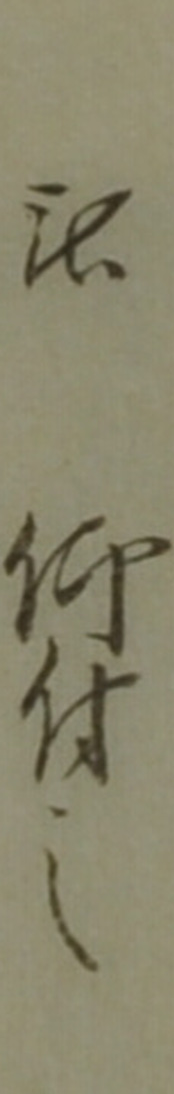被仰付之
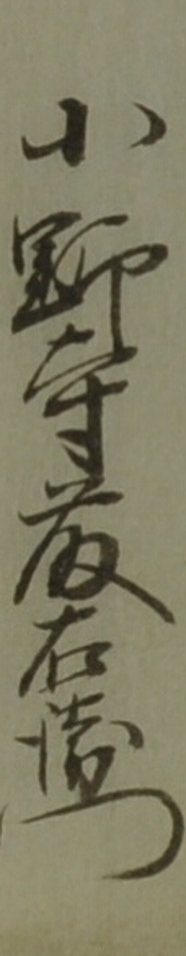小野寺藤右衛門
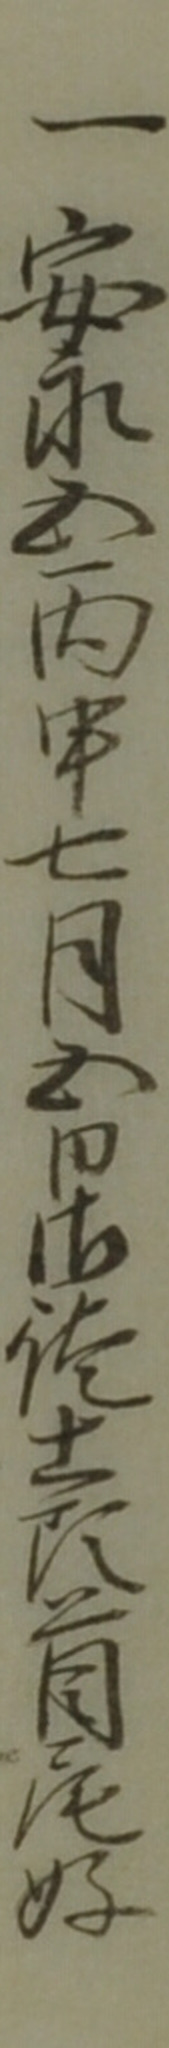一安永五丙申七月五日御徒士頭首尾好
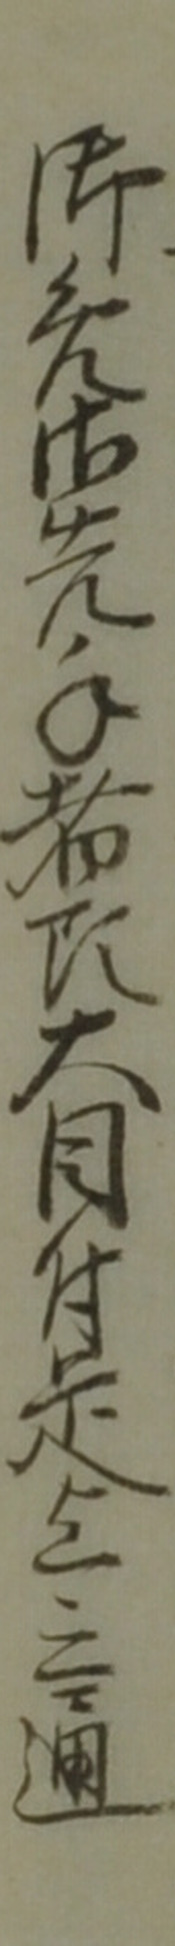御免御先手者頭大目付是迄之通
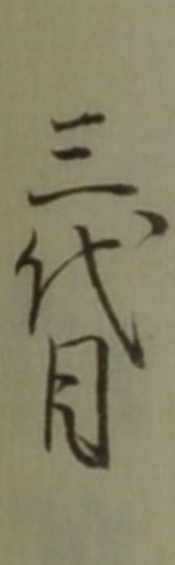三代目
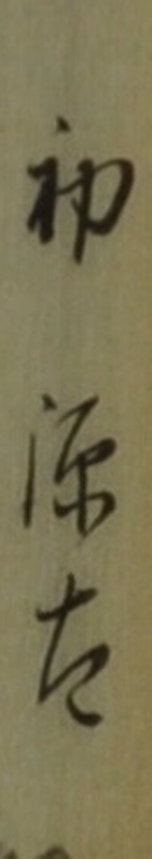初源太
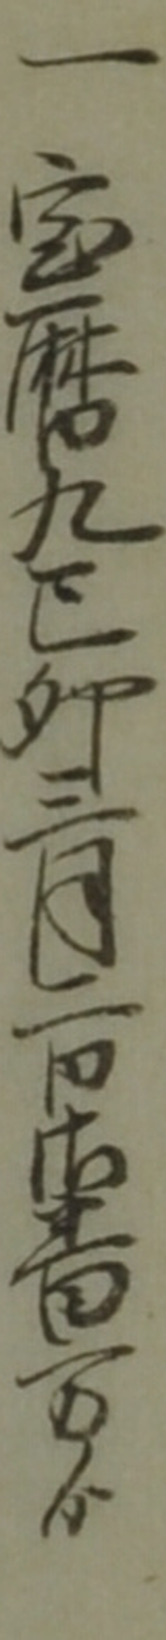一宝暦九己卯三月二日御番方ゟ
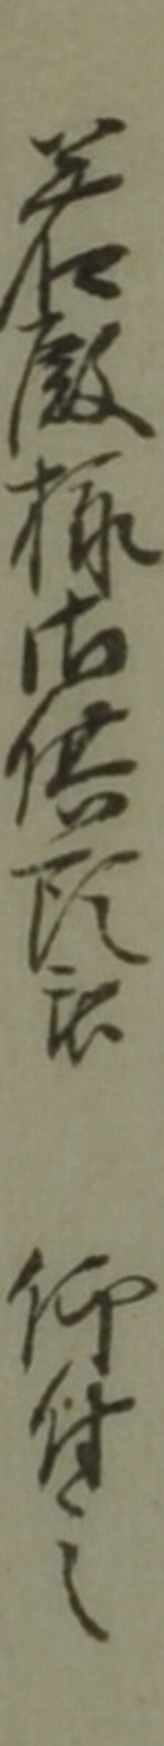若殿様御供頭被仰付之
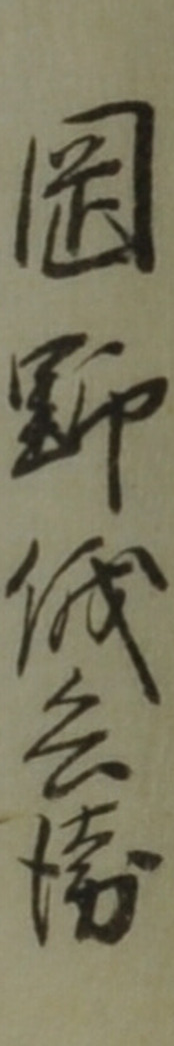岡野儀兵衛
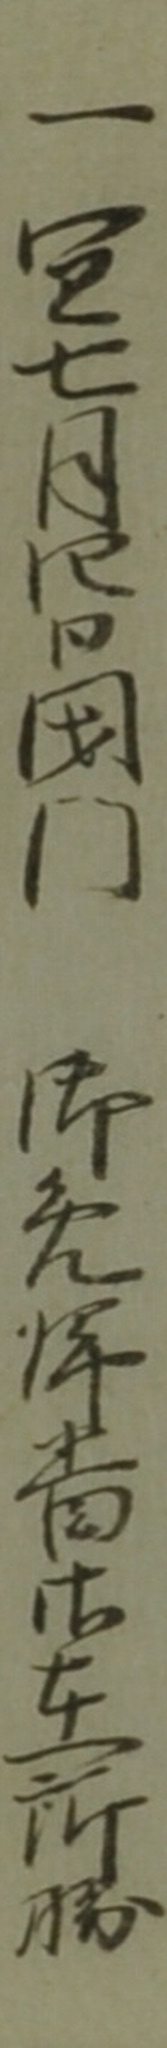一閏七月四日閉門御免帰番御在所勝
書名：諸御役代々録（六）
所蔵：伊那市立高遠町図書館・合同会社AMANE
